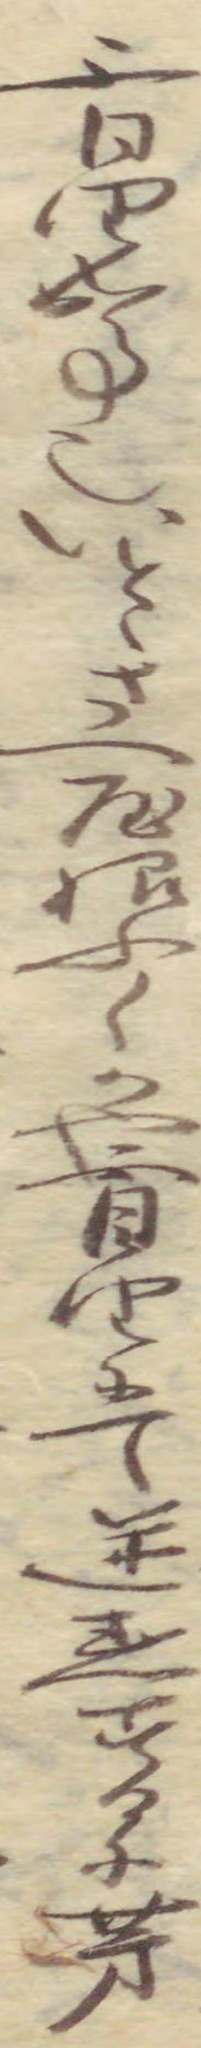不自由成事也いとゝさへ屋根ふくかや不自由にて迷惑するに茅
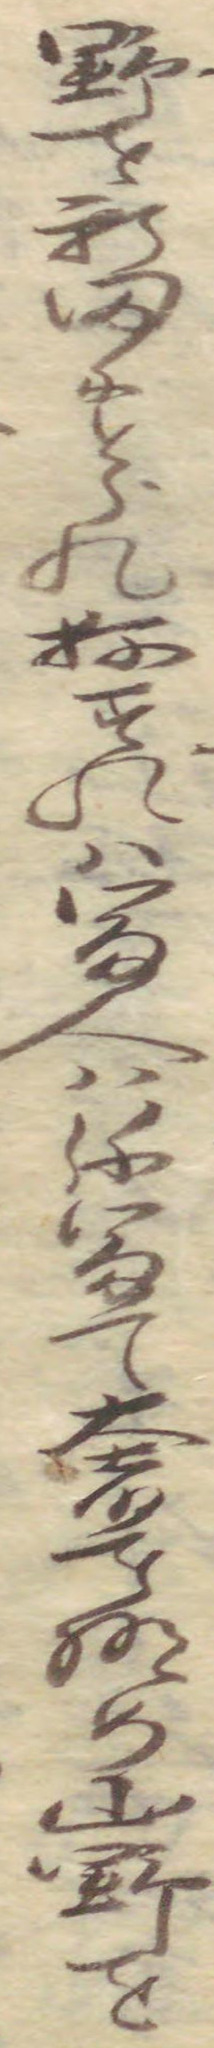野を新田にとられ抔すれは富人は弥富て奢を極め山野を
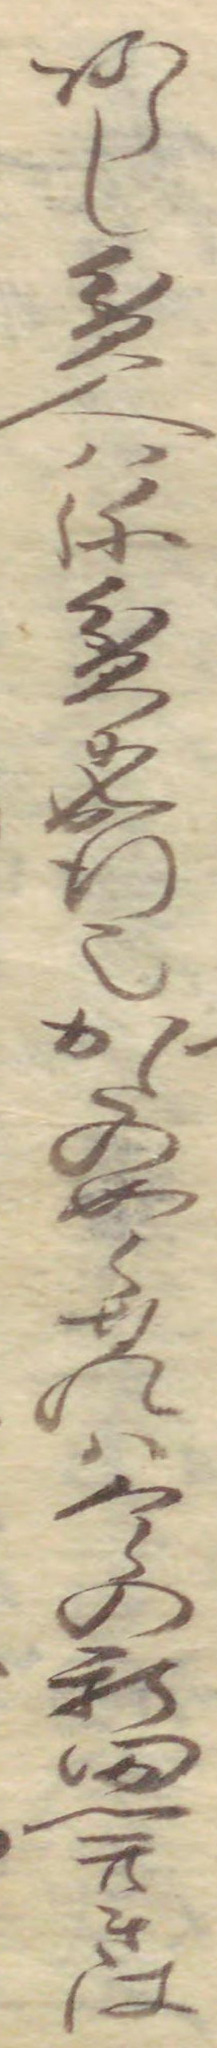あらし貧人は弥貧に成行也かくの如くなれは今の新田開きは
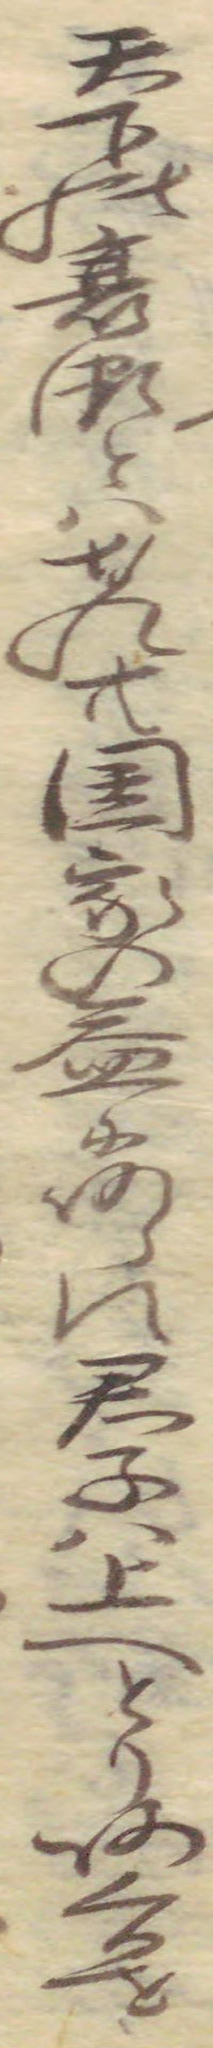天下の衰微とはなれ共国家の益にあらす君子は上へとりあくるを
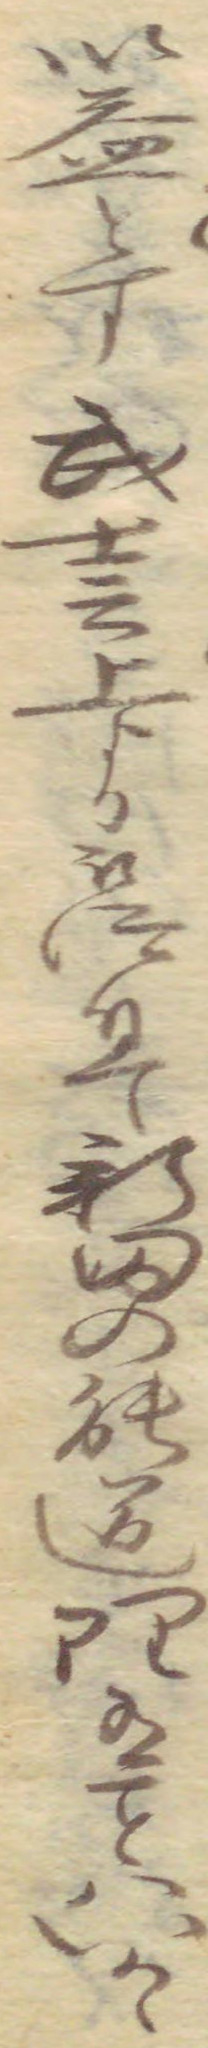以益とす武士云上より被仰付て新田の能道理有ことはいかゝ

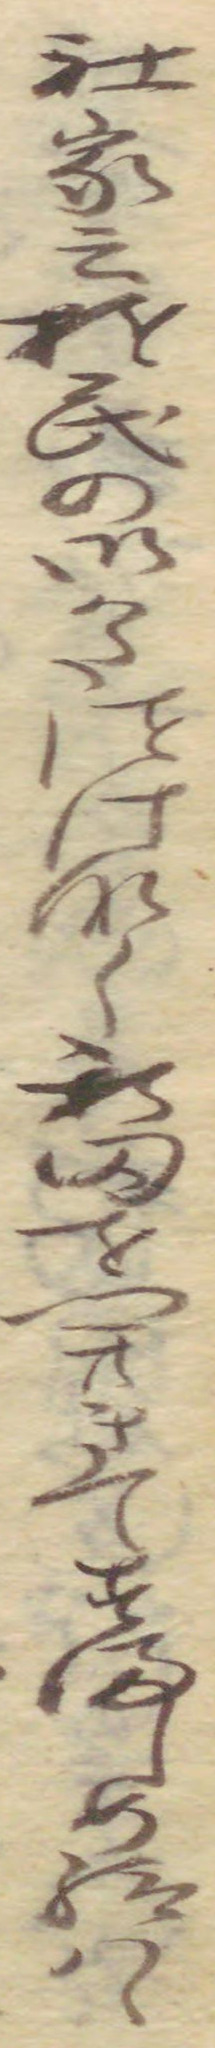社家云遊民の御かたつけなく新田を開きてすましめ給はゝ
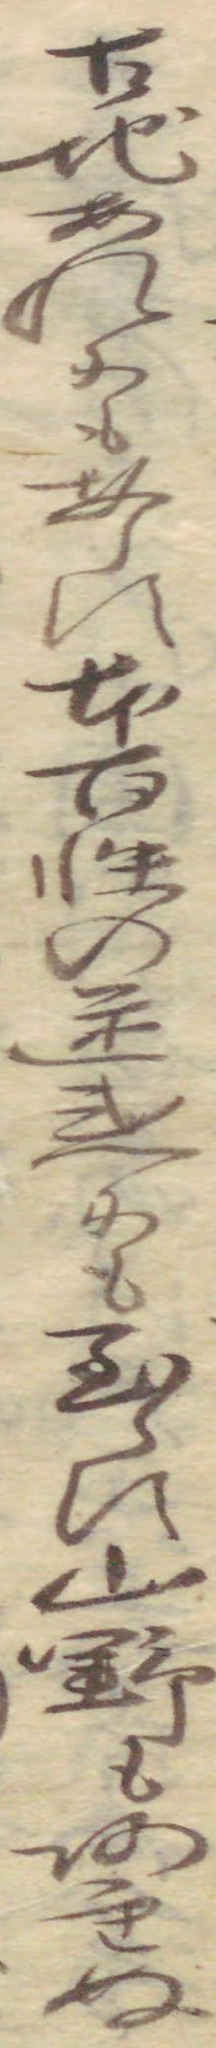古地あれにもならす本百姓の迷惑にも至らす山野もあれぬ
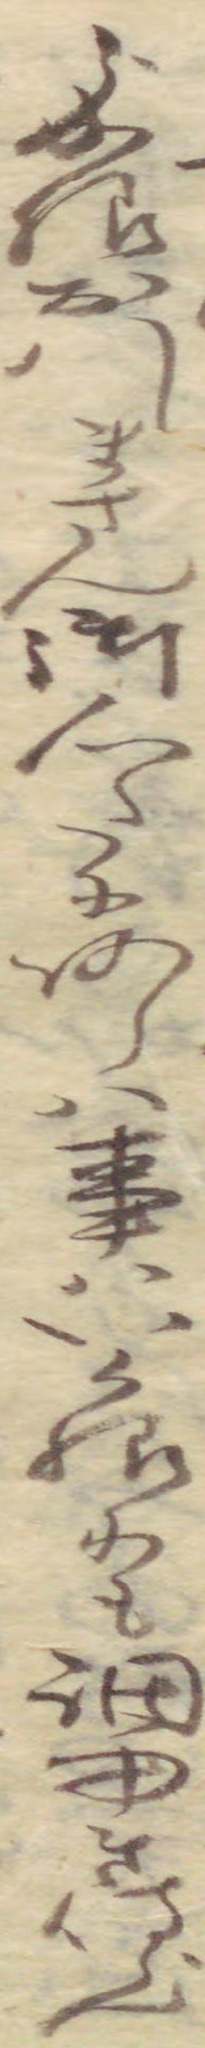被成様おはしまさん御心たにあらは事はいか様にも調ゆき侍らん
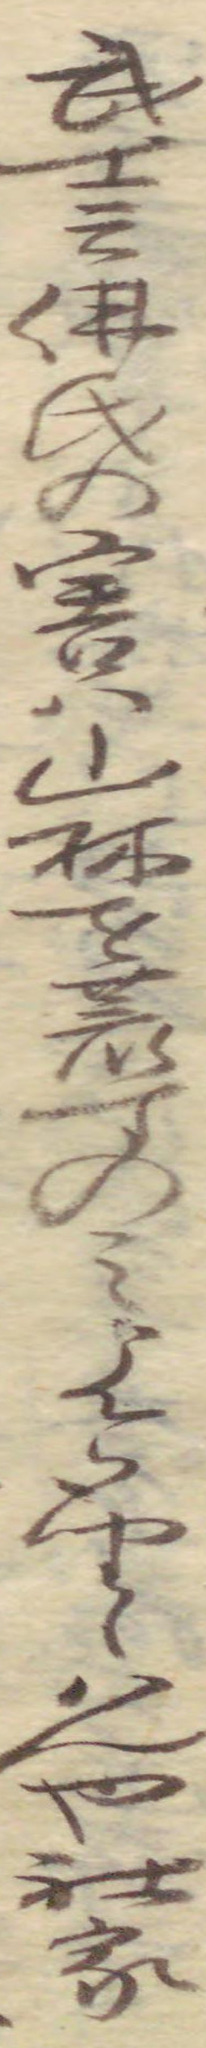武士云仏氏の害は山林を荒すのみニて御座候はんや社家
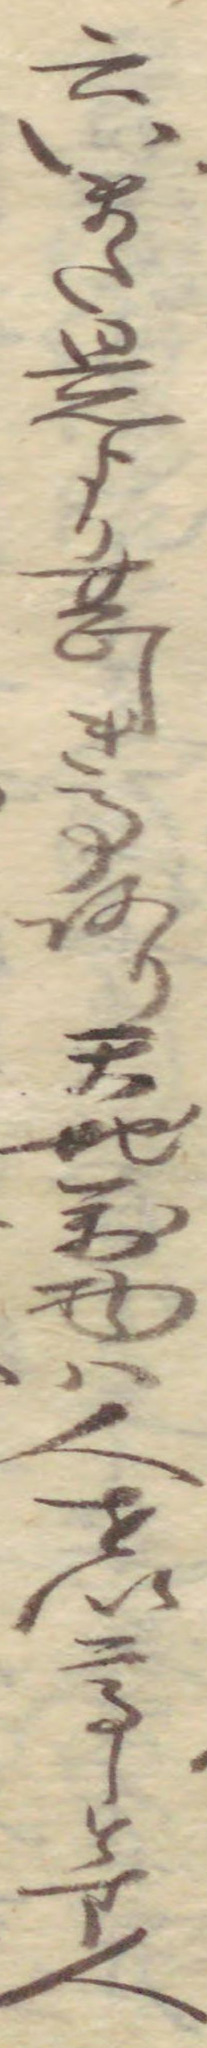云いまた是より甚しき事あり天地万物は人を以尊しとす人
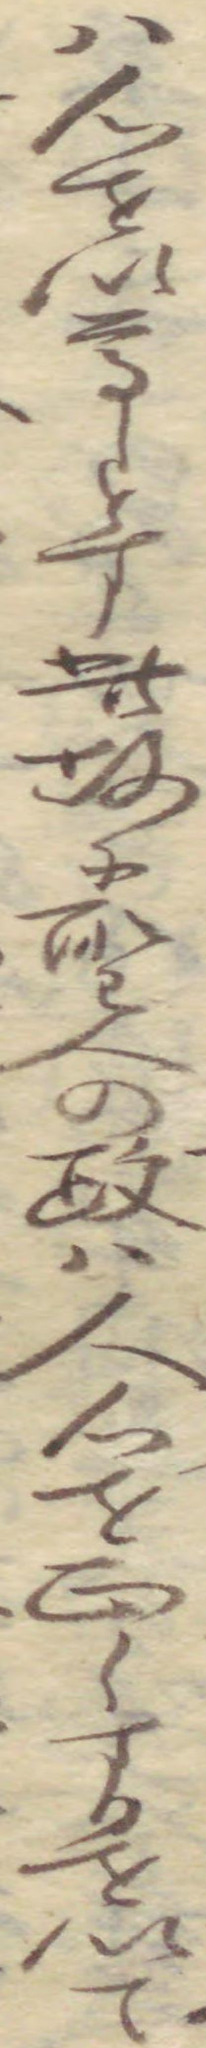は心を以尊しとす此故に聖人の政は人心を正くするを以て
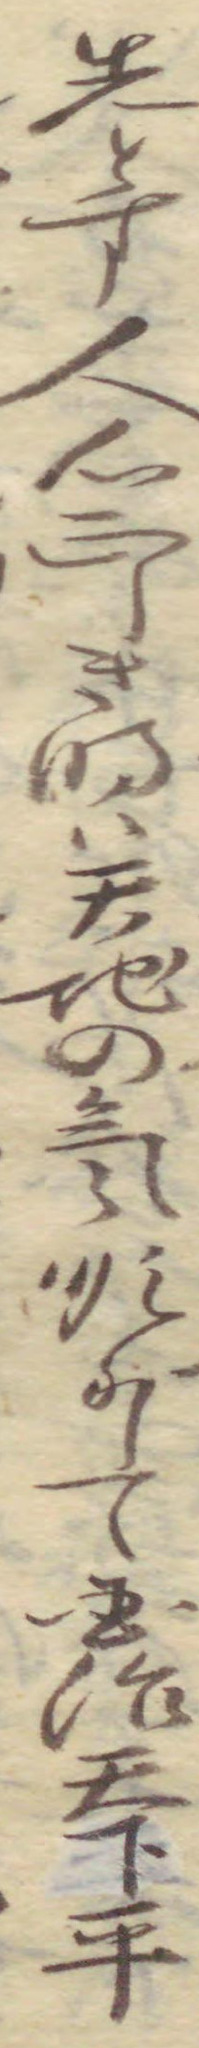先とす人心正しき時は天地の気順にして国治天下平
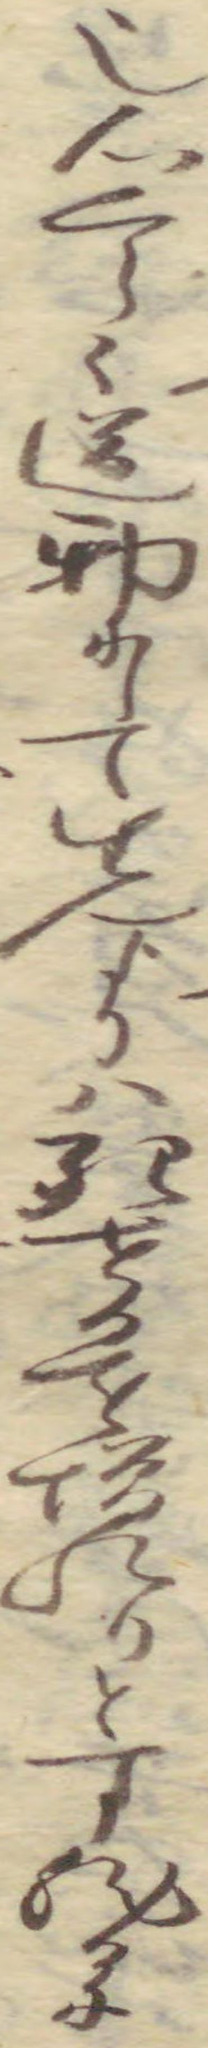也心くらく道邪にして生んよりは死せるを増れりとす然るに
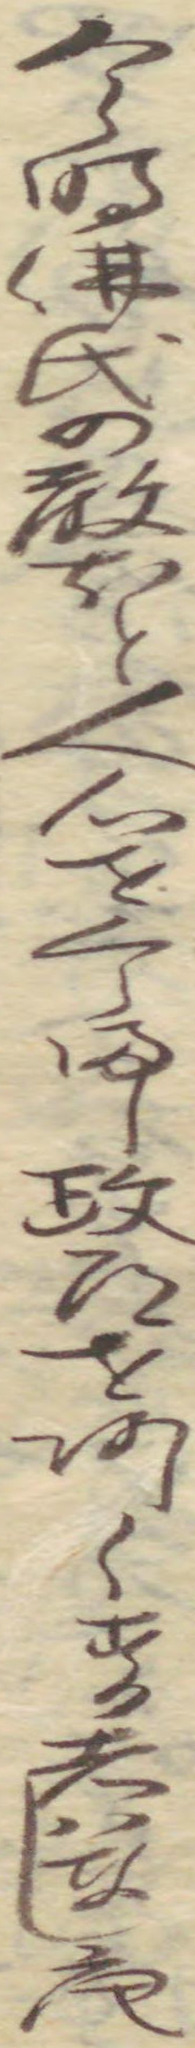今時仏氏の教ほと人心をくらまし政道をあしくする者はなし唐
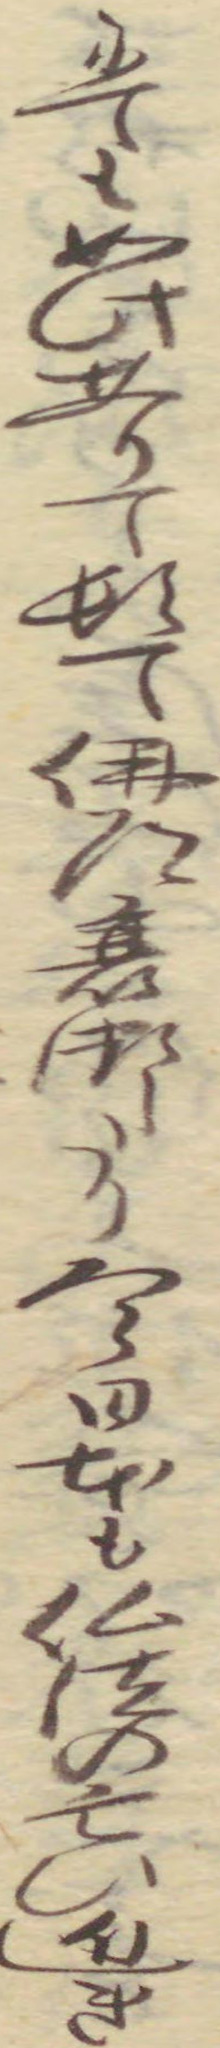にても如此なりて頓て仏道衰微したり今日本も仏法の亡ひ近き
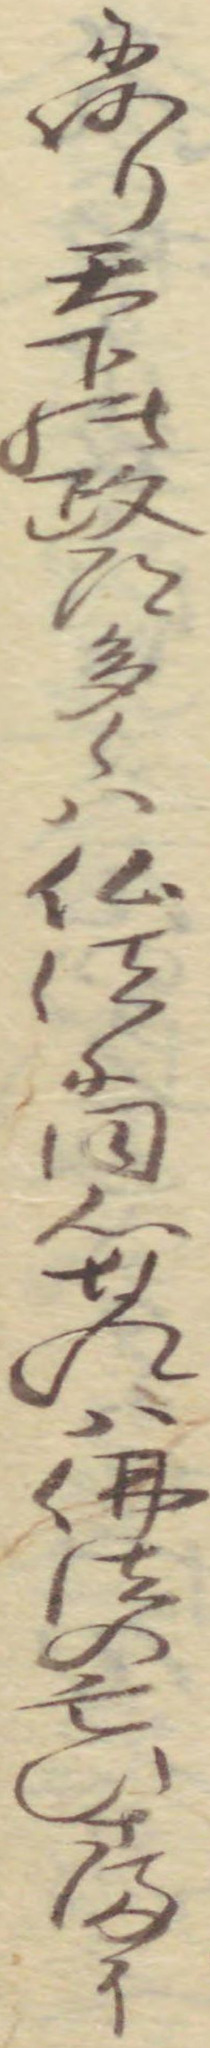にあり天下の政道多くは仏法に同心なれは仏法の亡ひさまに
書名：鶯宿雑記. 巻263-264
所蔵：国立国会図書館 National Diet Library, JAPAN
